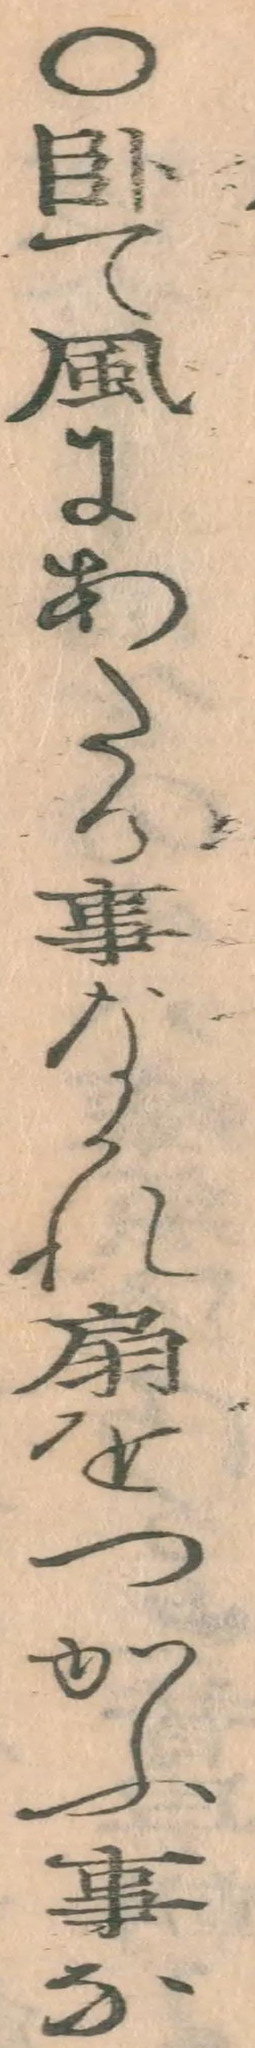〇臥て風にあたる事なかれ扇をつかふ事な
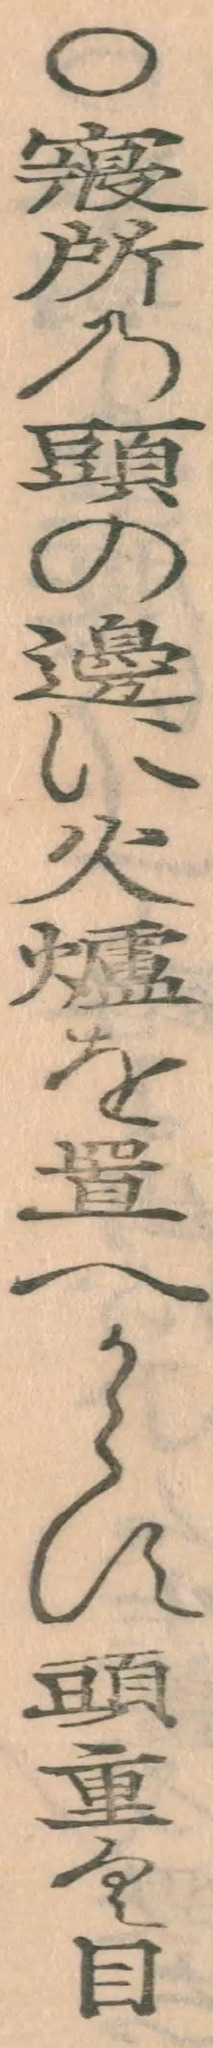〇寝所の頭の辺に火炉を置へからす頭重く目
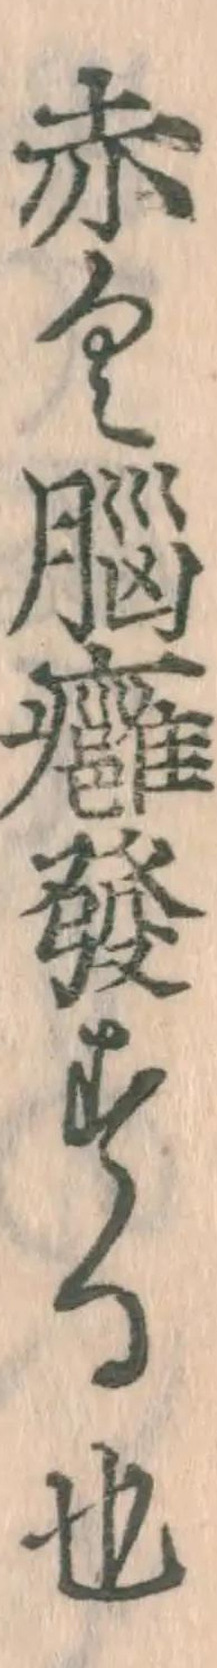赤く脳癰発する也
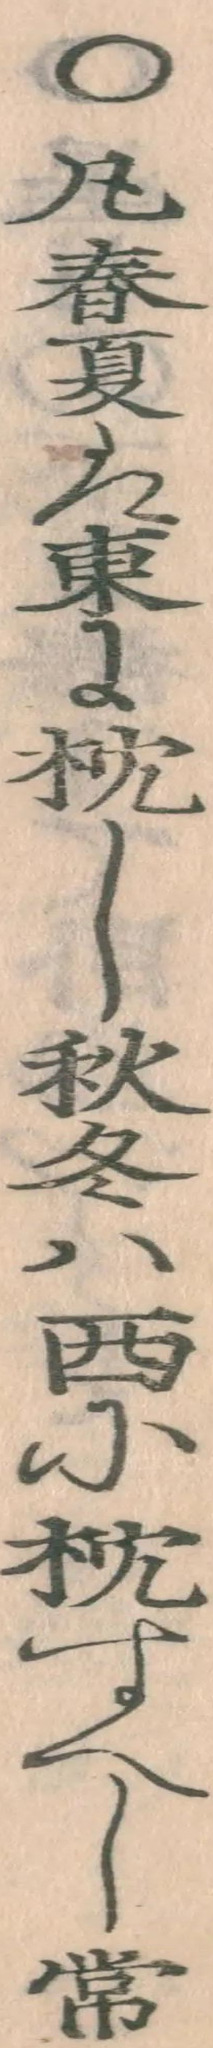〇凡春夏は東に枕し秋冬は西に枕すへし常
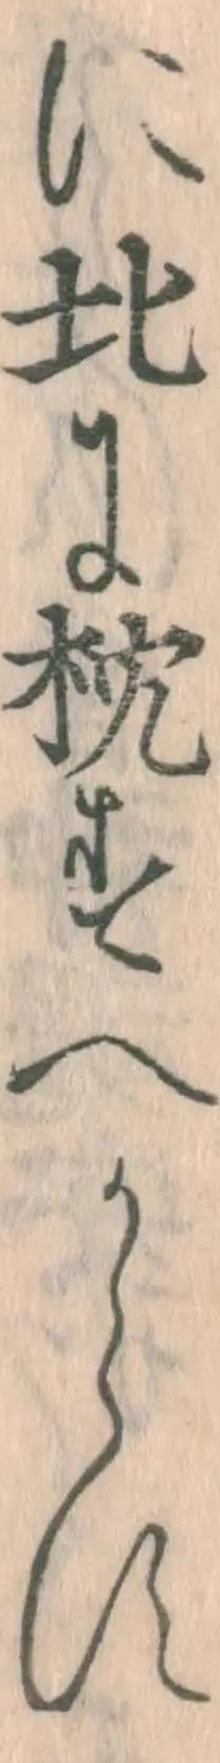に北に枕すへからす
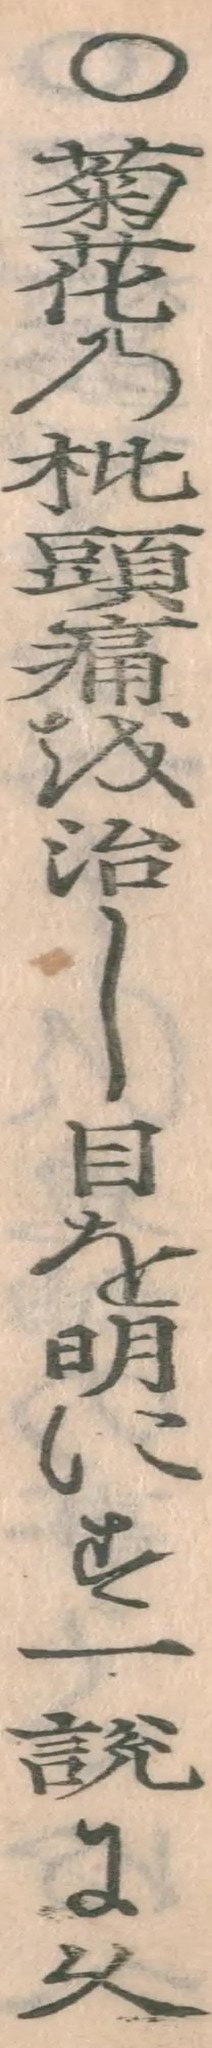〇菊花の枇頭痛を治し目を明にす一説にく
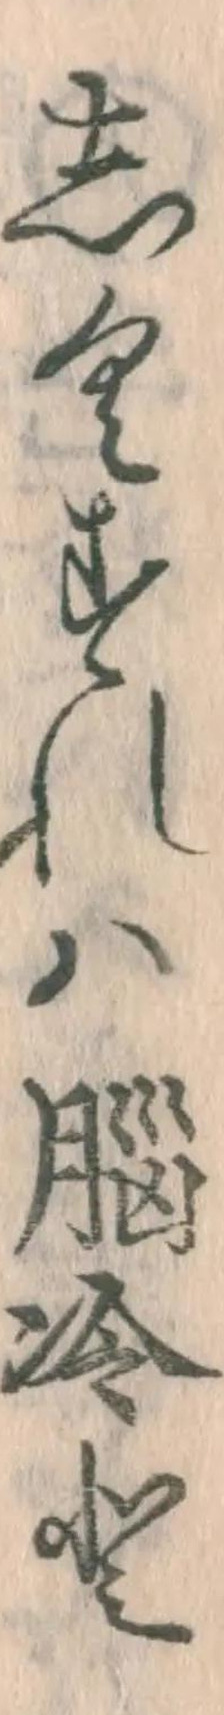しくすれは脳冷と
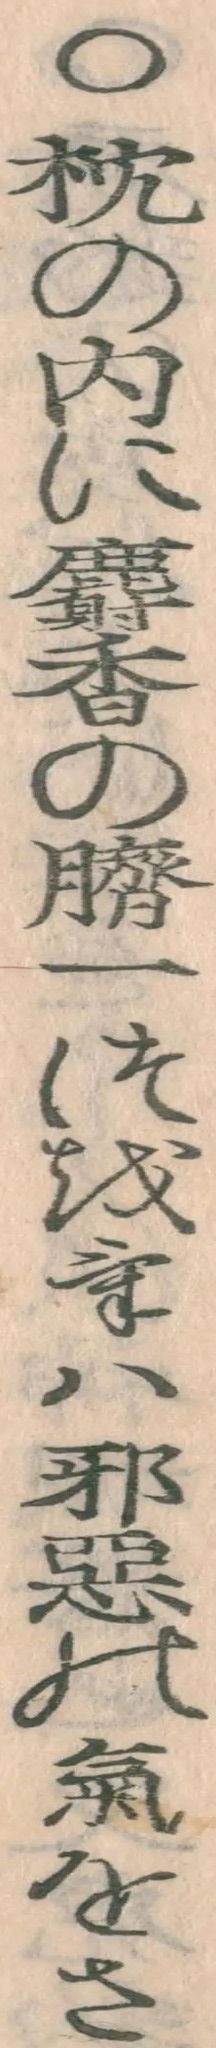〇枕の内に麝香の臍一つをけは邪悪の気をさ
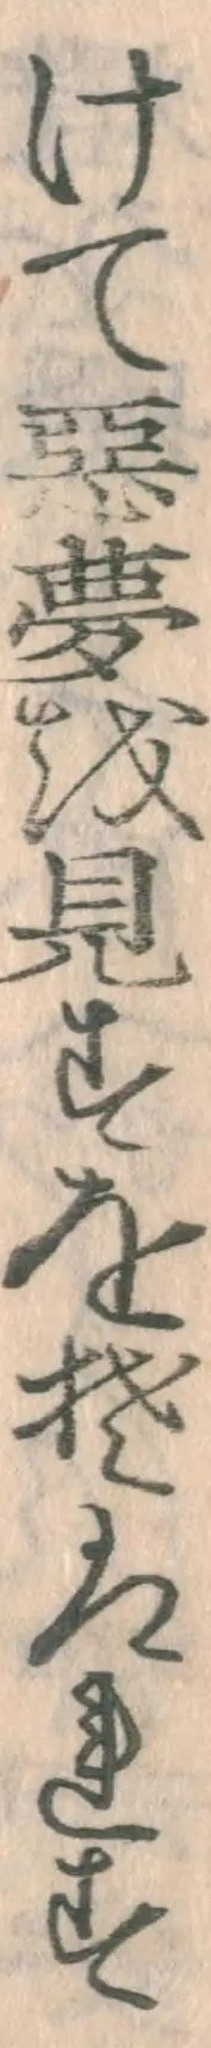けて悪夢を見すをそはれす
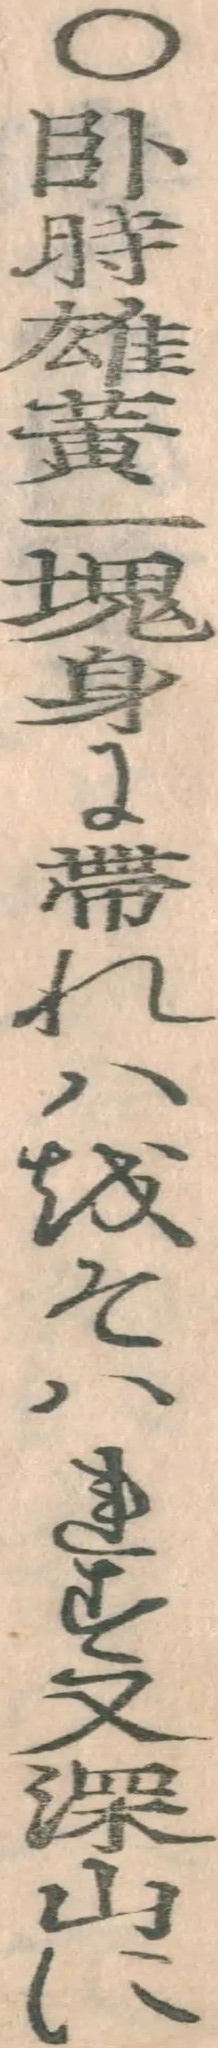〇臥時雄黄一塊身に帯れはをそはれす又深山に
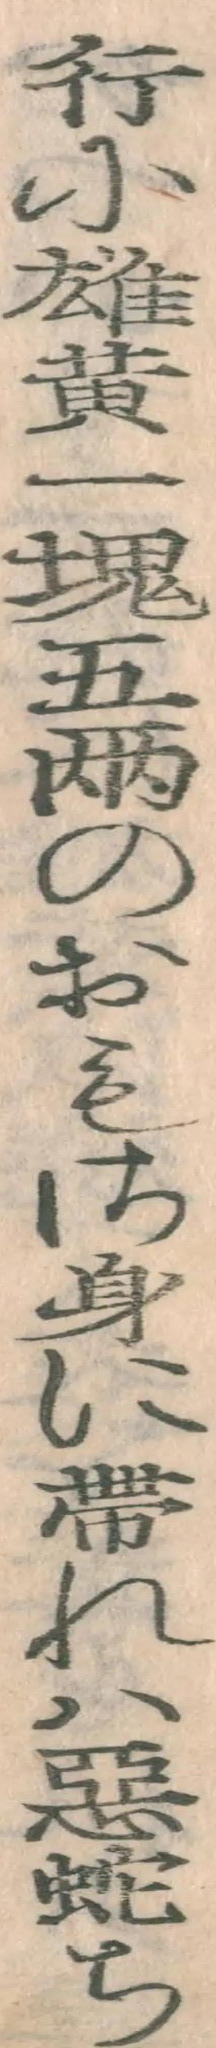行に雄黄一塊五両のおもさ身に帯れは悪蛇ち

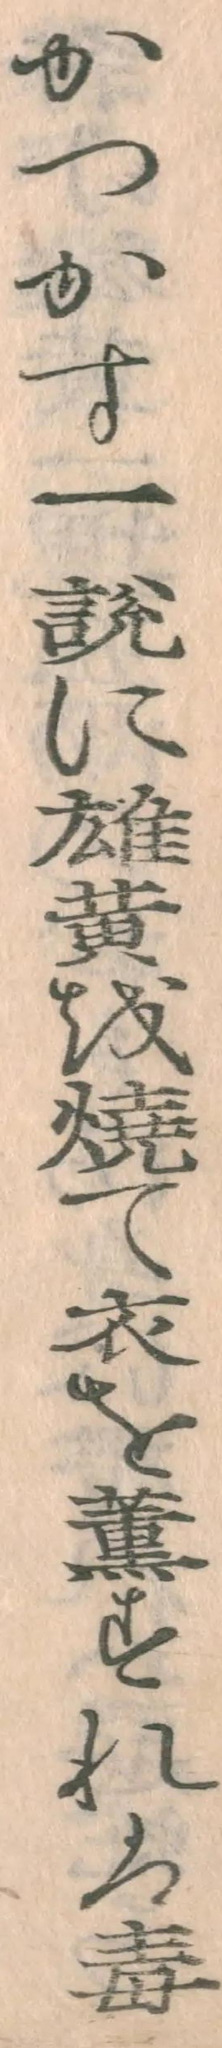かつかす一説に雄黄を焼て衣を薫すれは毒
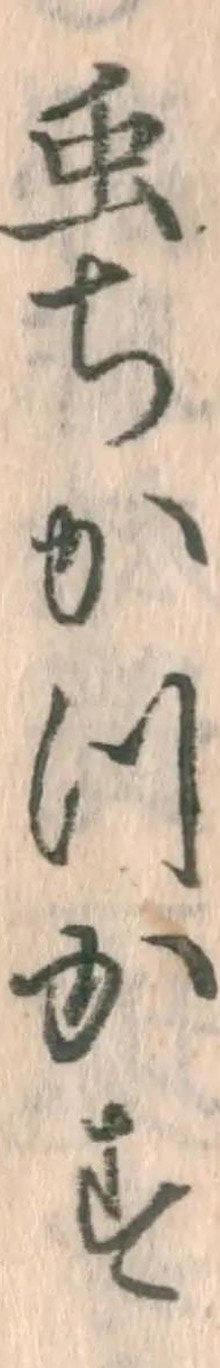虫ちかつかす
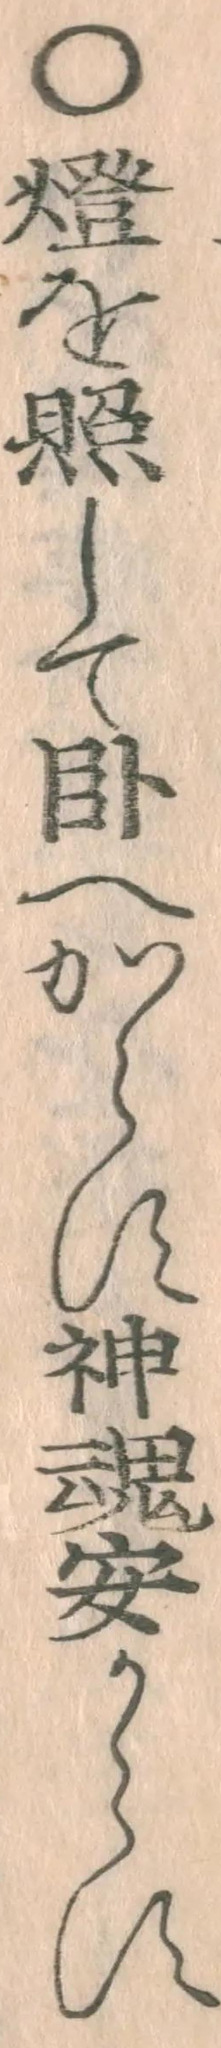〇灯を照して臥へからす神魂安からす
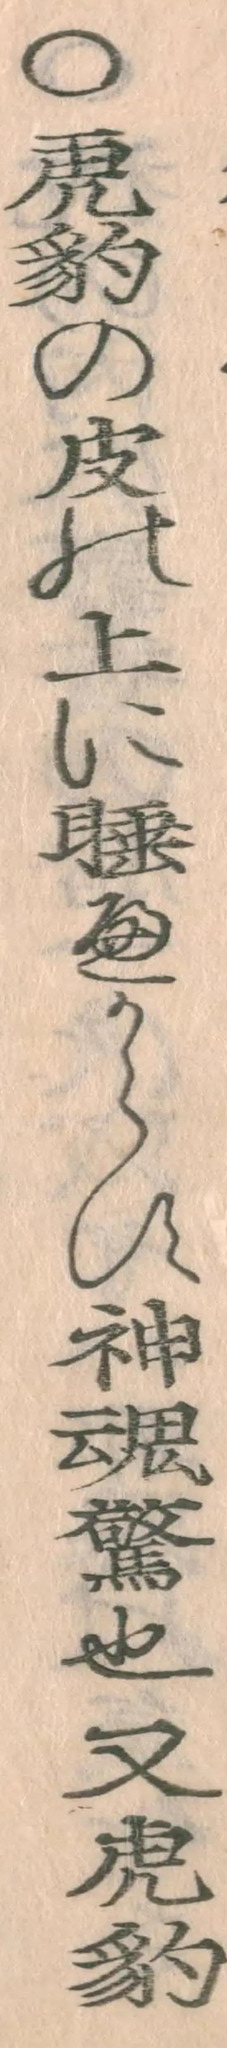〇虎豹の皮の上に睡へからす神魂驚也又虎豹
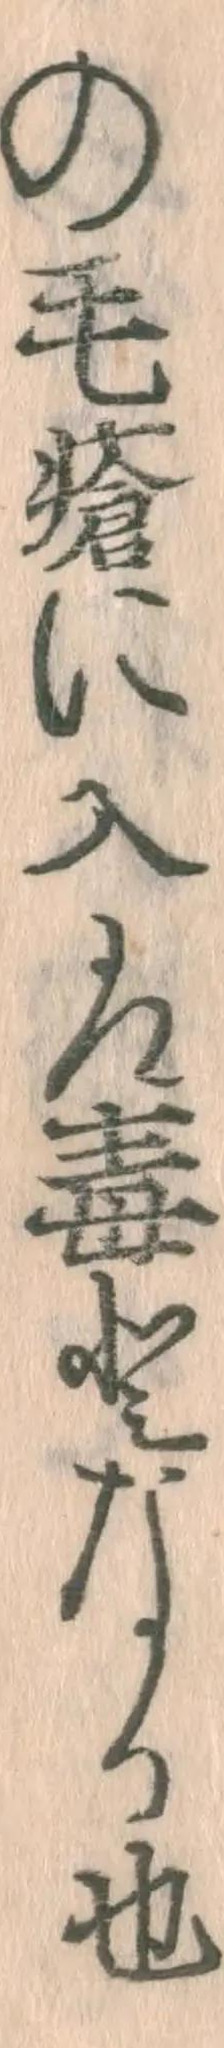の毛瘡に入は毒となる也
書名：延壽撮要
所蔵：国立国会図書館 National Diet Library, JAPAN
